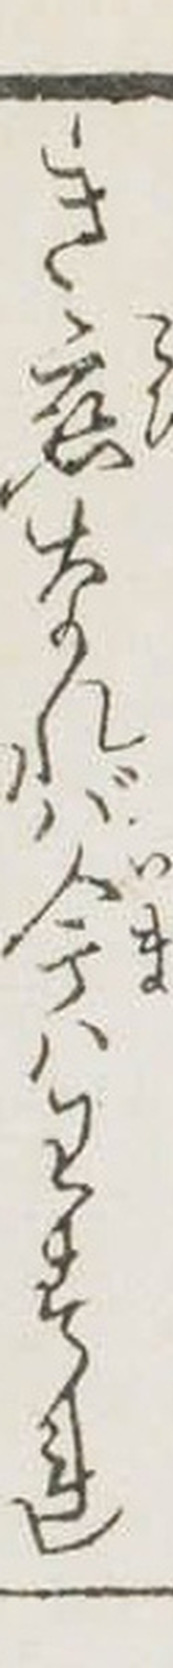き恋なれば今はわすれ腎
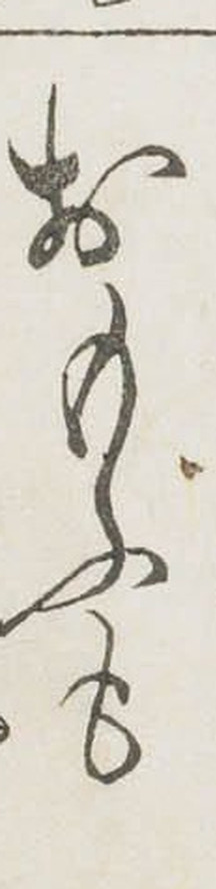おもふも
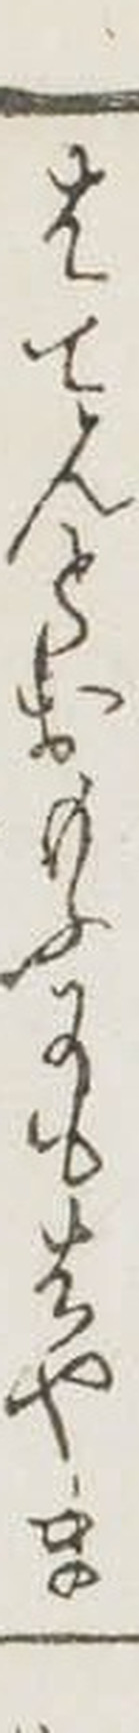はてんとおもふにもはやま
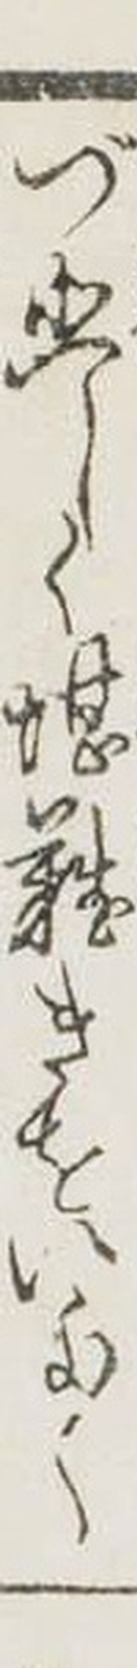づ悲しく堪難きをいよ〳〵
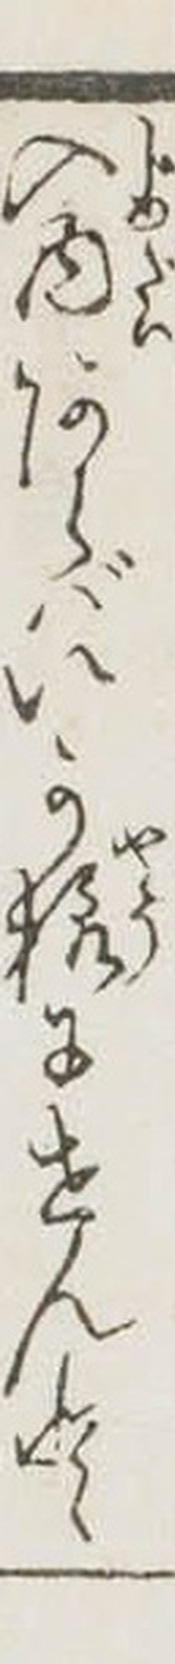入内あらばいか様にせんと
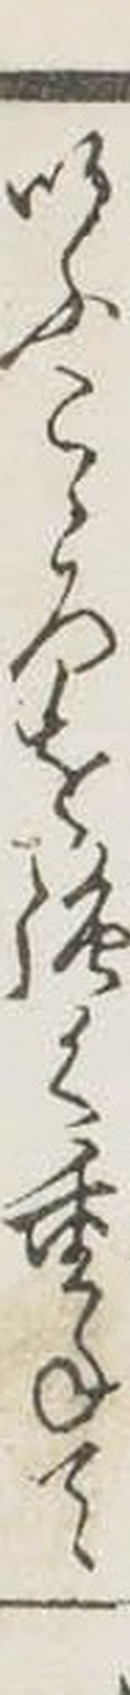いふこゝろを強く重ねて
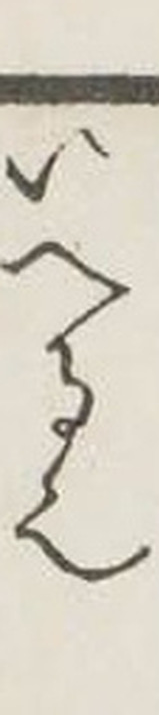いへる也
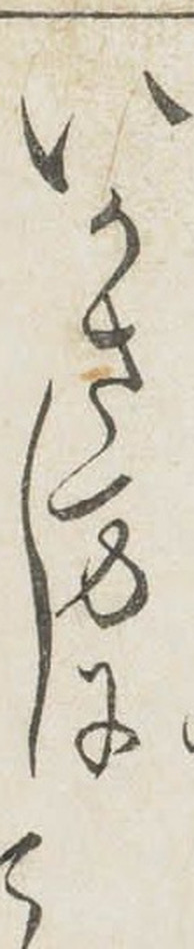いかさまに
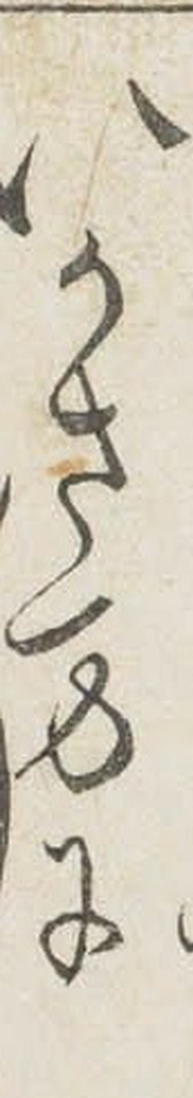いかさまに
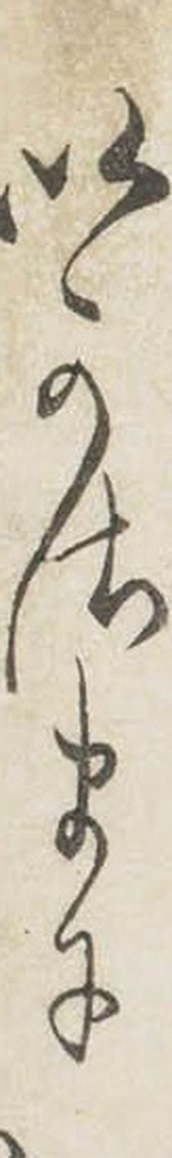いかさまに

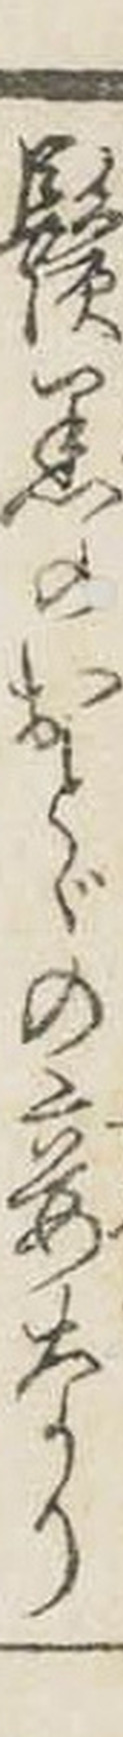鬚黒のおとゞの妾なり
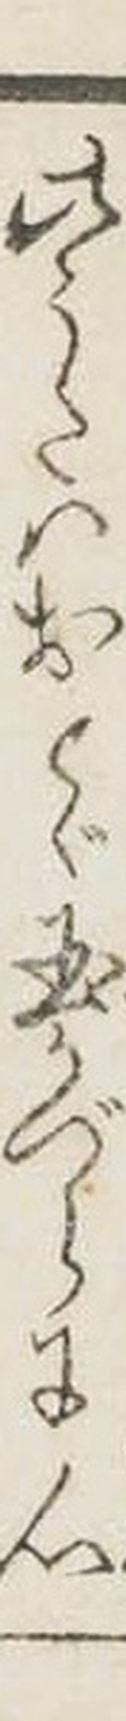此うたはおとゞ玉かづらに心
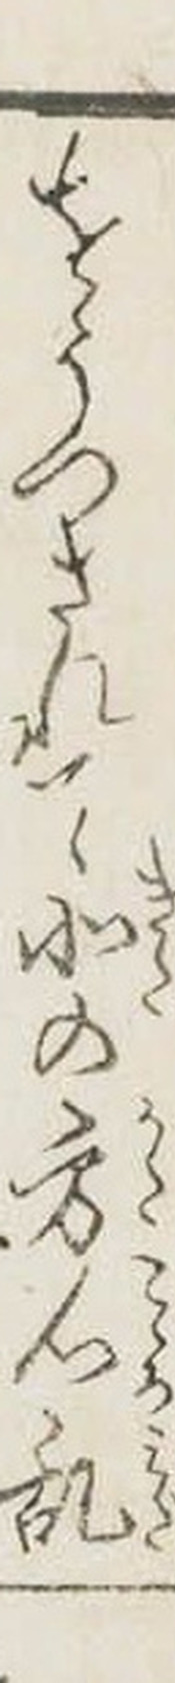をうつされて北の方心乱
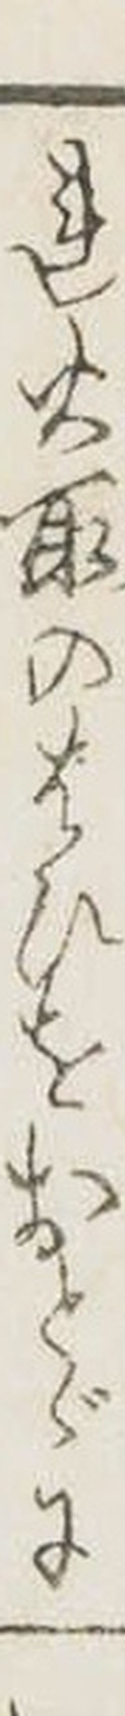れ火取のはひをおとゞに
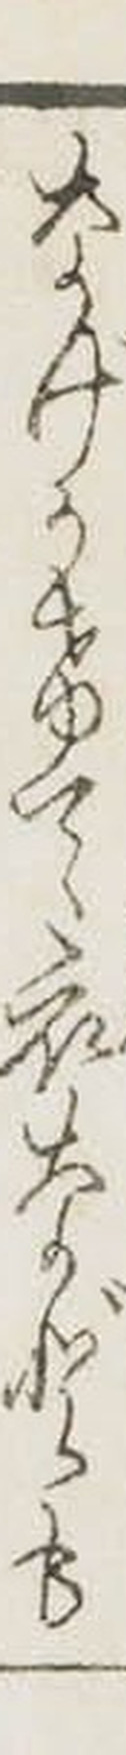なげかけて衣なども
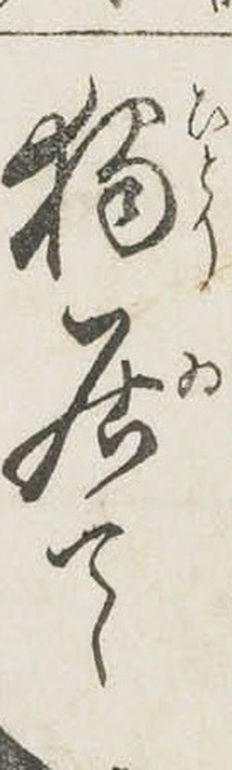独居て
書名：源氏百人一首
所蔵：東京学芸大学教育コンテンツアーカイブ
